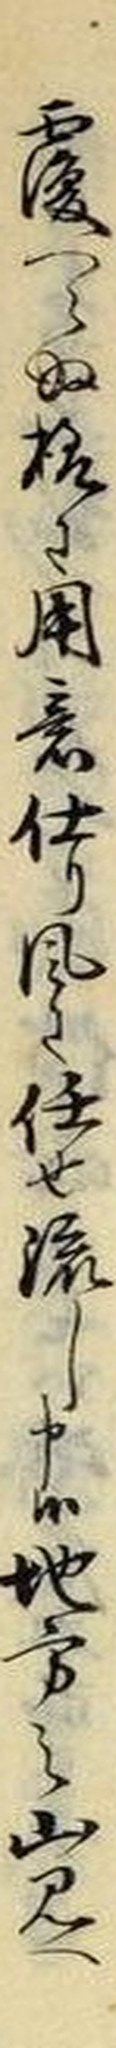覆へらぬ様に用意仕り風に任せ流し申候地方之山見へ
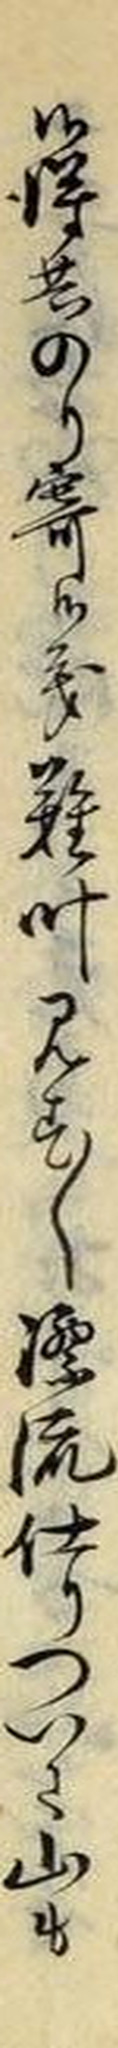候得共のり寄候義難叶みす〳〵漂流仕りついに山も
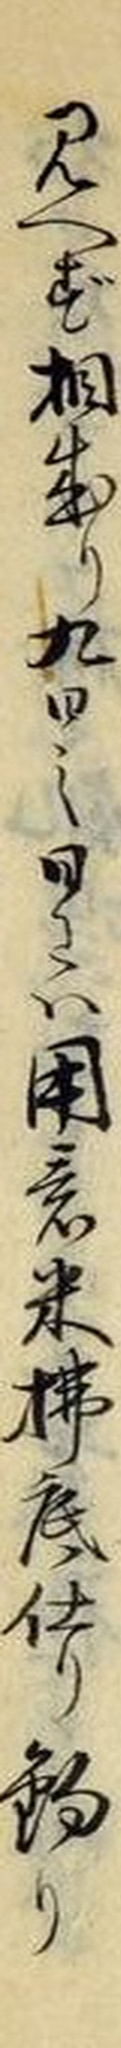見へず相成り九日之日にハ用意米拂底仕り釣り
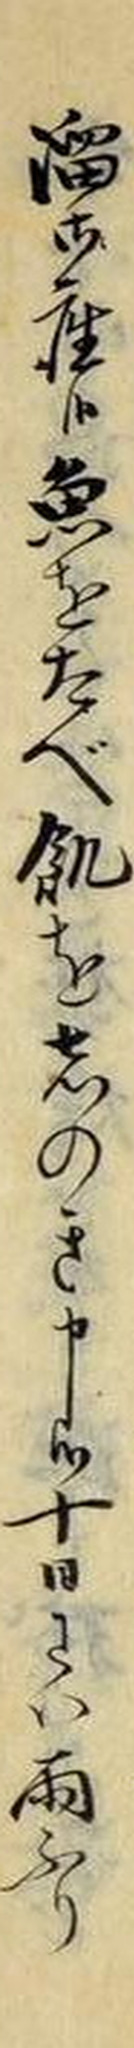溜御座候魚をたべ飢をしのき申候十日にハ雨ふり

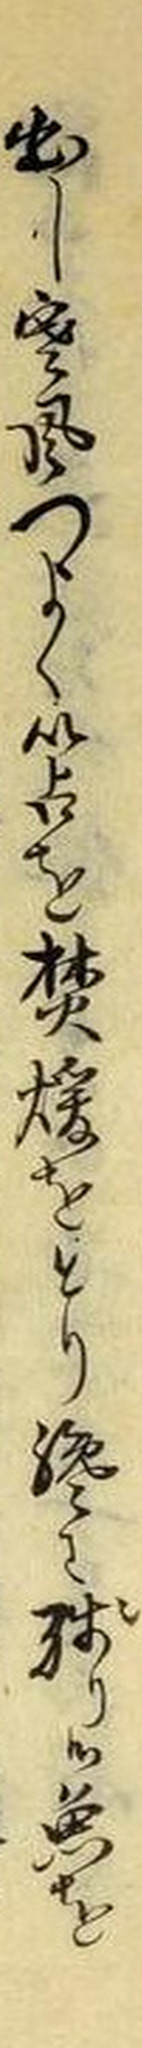出し寒風つよく苫を焚煖をとり纔に残り候魚を
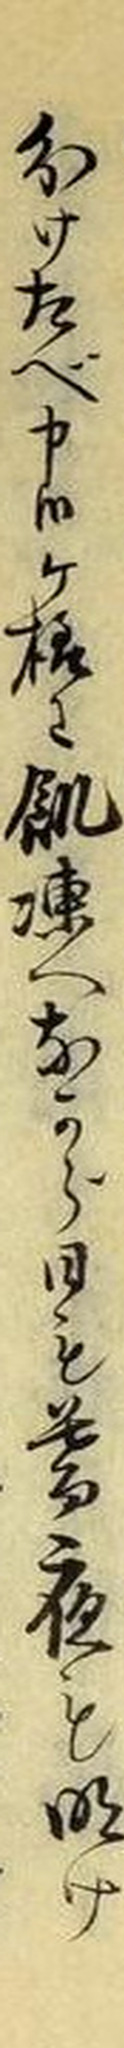分けたべ申候ケ様に飢凍へなから日も暮夜も明け
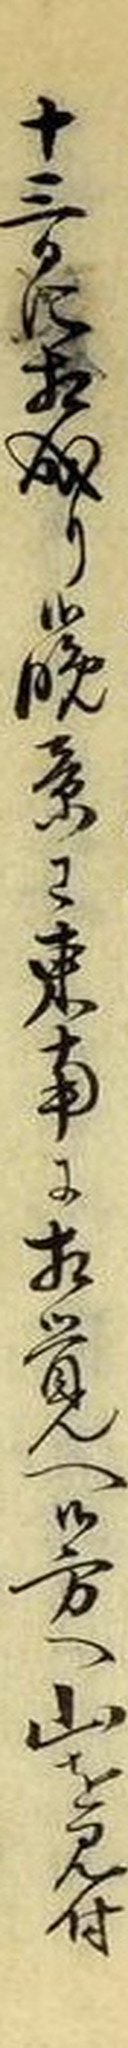十三日に相成り候晩景に東南に相覚へ候方へ山を見付
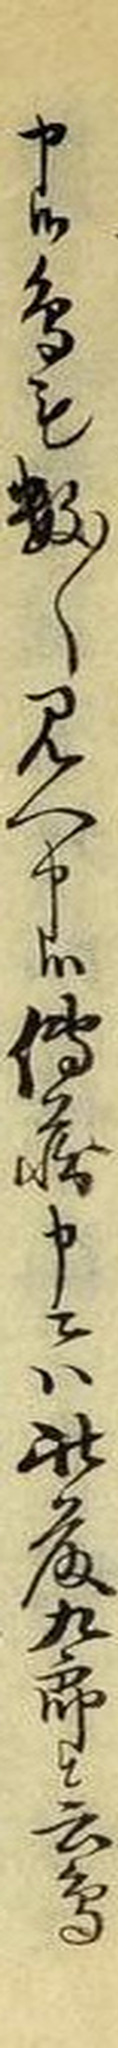申候鳥も数〳〵見へ申候傳蔵申ニハ此藤九郎と云島
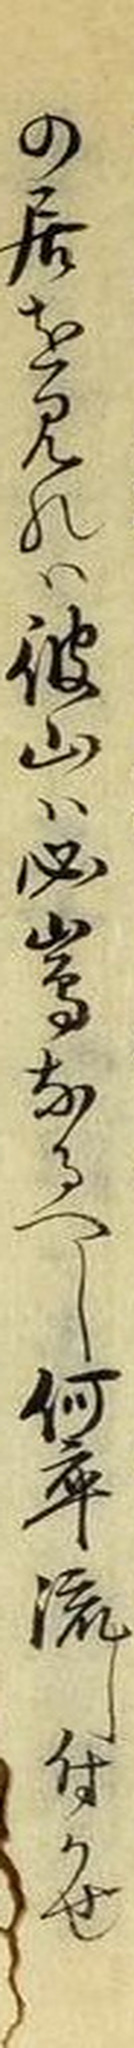の居を見れハ彼山ハ必島なるへし何卒流し付かせ
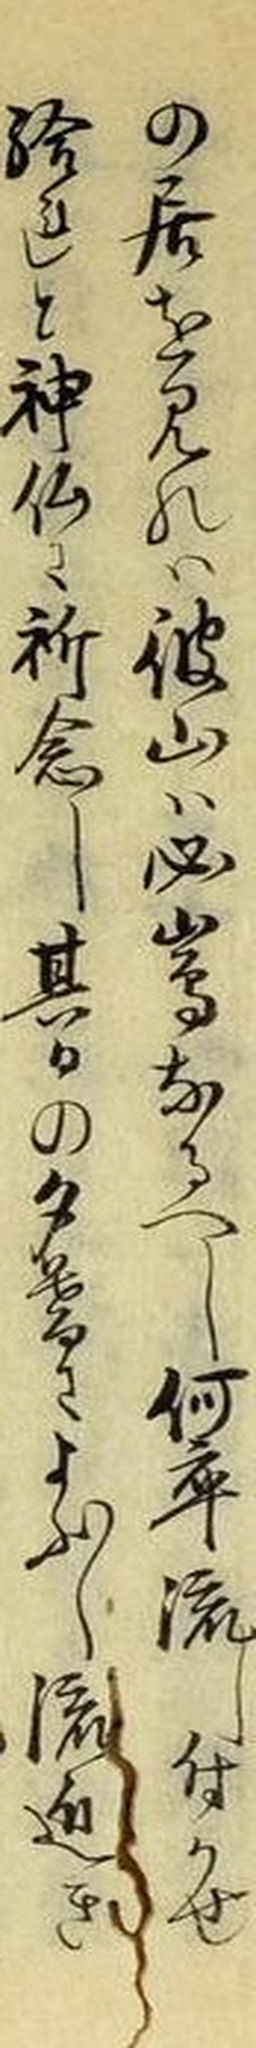給れと神仏に祈念し其日の夕暮によふ〳〵流近き
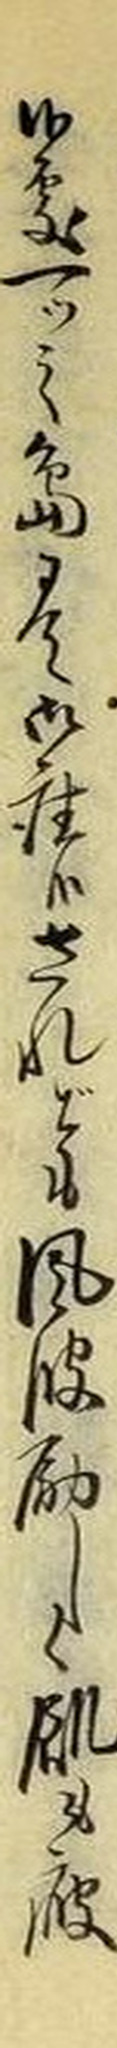候處一ツ之島には御座候されども風波励しく飢も疲
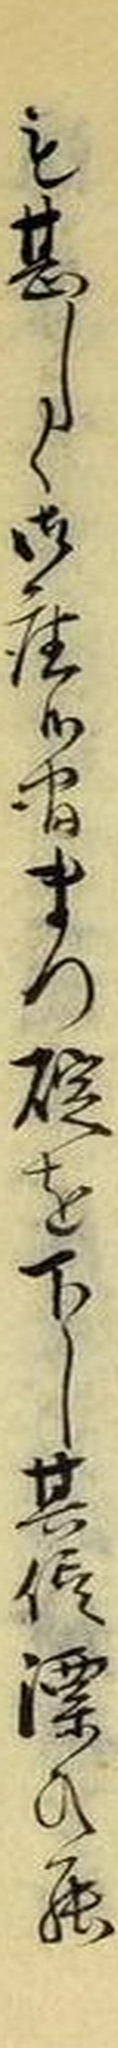も甚しく御座候間まつ碇を下し其侭漂ひ罷
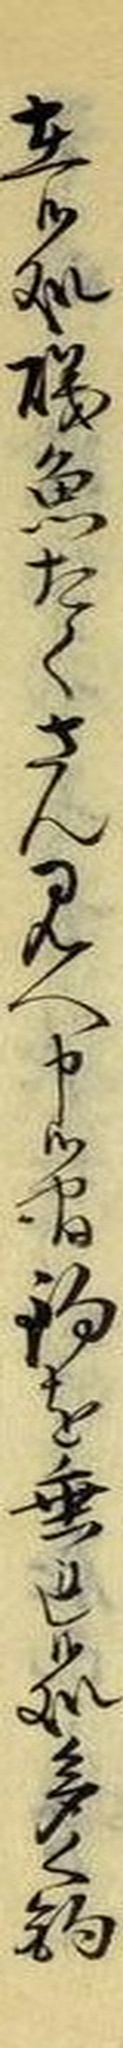在候処磯魚たくさん見へ申候間釣を垂れ候処多く釣
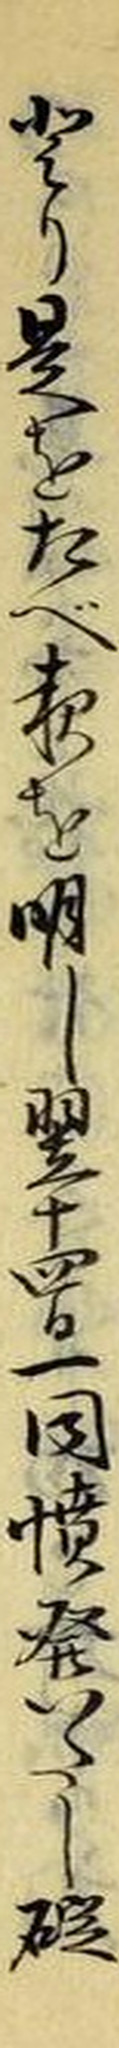たり是をたべ夜を明し翌十四日一同憤発いたし碇
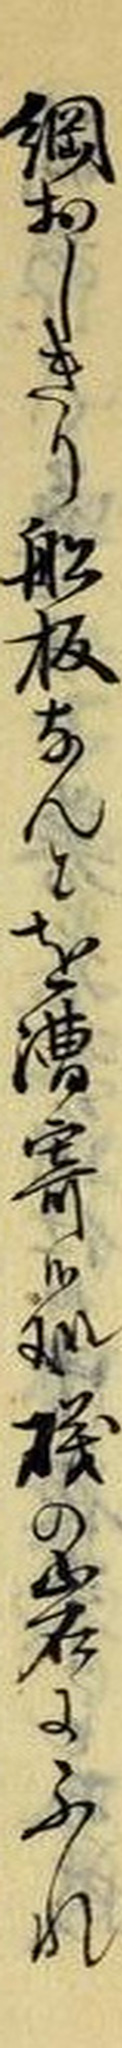綱おしきり船板なんとを漕寄候処磯の岩にふれ
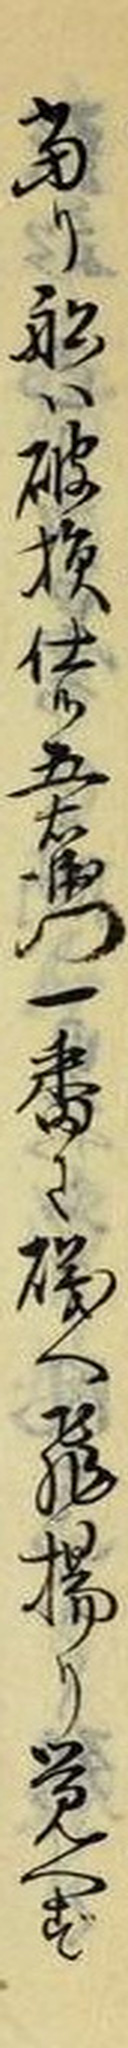当り船ハ破損仕候五右衛門一番に磯へ飛揚り覚へず
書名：漂客談奇（備考雑録写8）
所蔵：福井県文書館 Fukui Prefectural Archives
